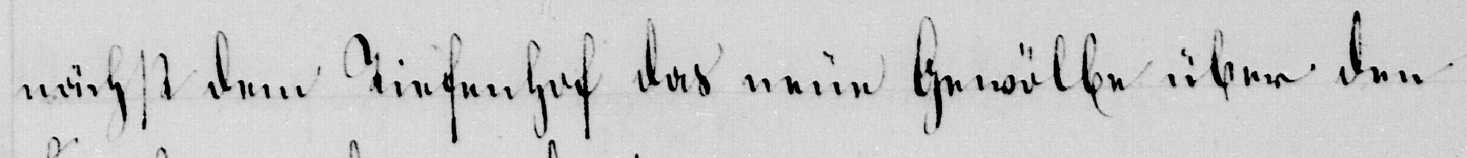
nächst dem Tiefenhof das neue Gewölbe über den
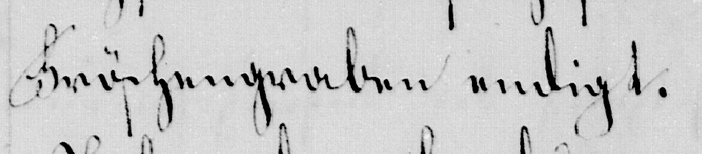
Fröschengraben endigt.
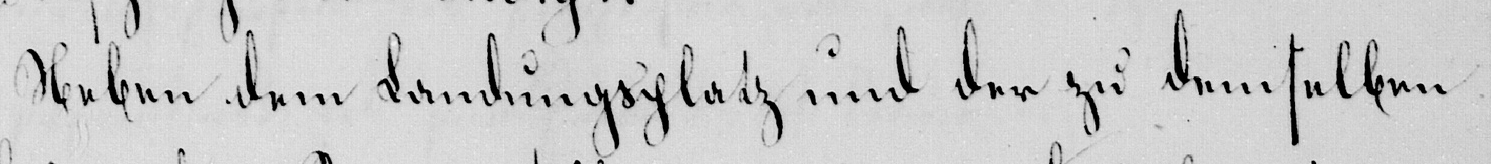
Neben dem Landungsplatz und der zu demselben
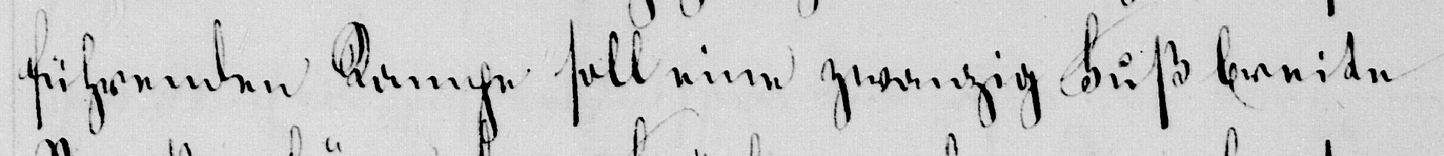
führenden Rampe soll eine zwanzig Fuß breite
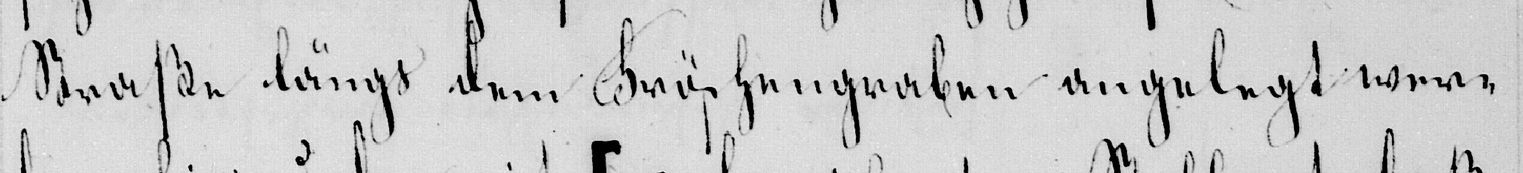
Straße längs dem Fröschengraben angelegt wer¬
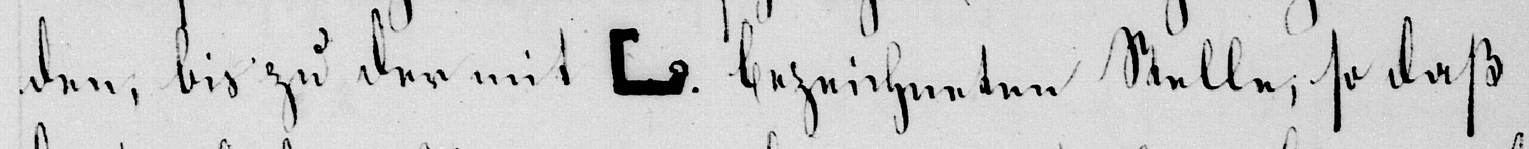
den, bis zu der mit [s. O.] bezeichneten Stelle, so daß
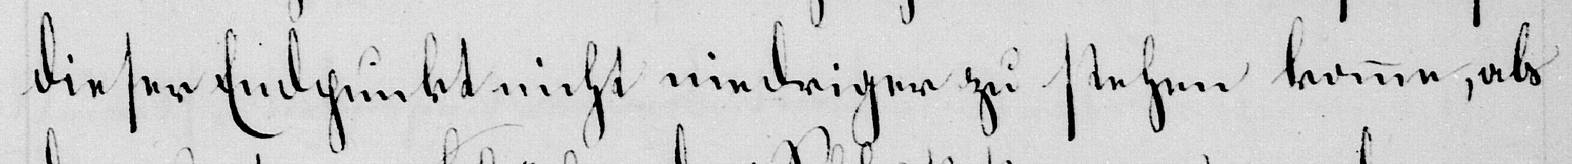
dieser Endpunkt nicht niedriger zu stehen komme, als
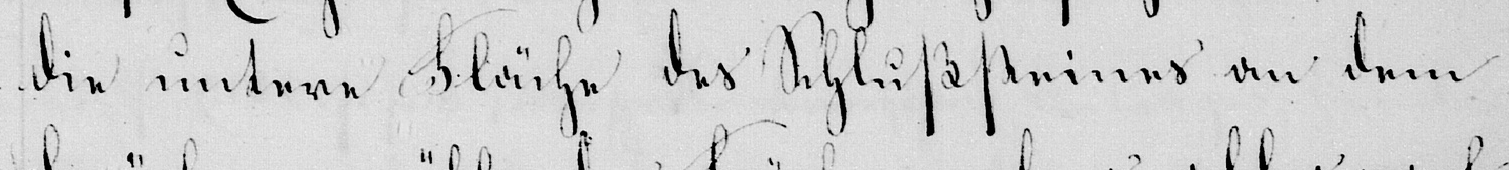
die untere Fläche des Schlußsteines an dem
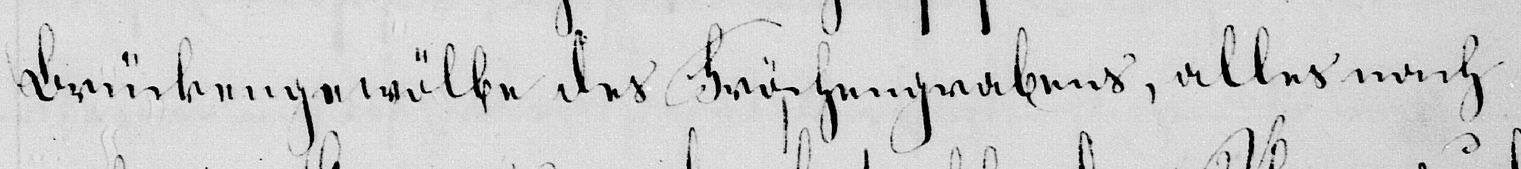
Brückengewölbe des Fröschengrabens, alles nach
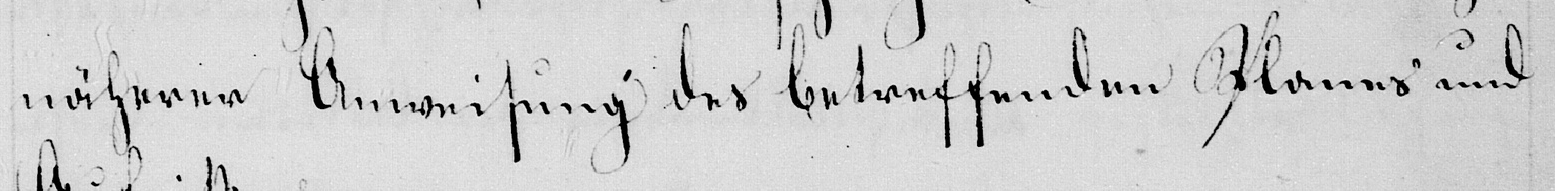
näherer Anweisung des betreffenden Planes und
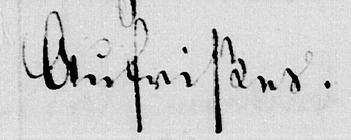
Aufrißes.
